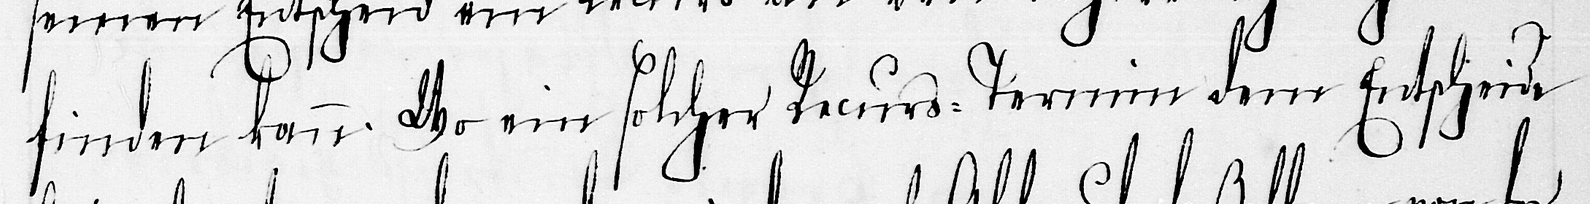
finden kann. Wo ein solcher Recurs-Termin dem Entscheide
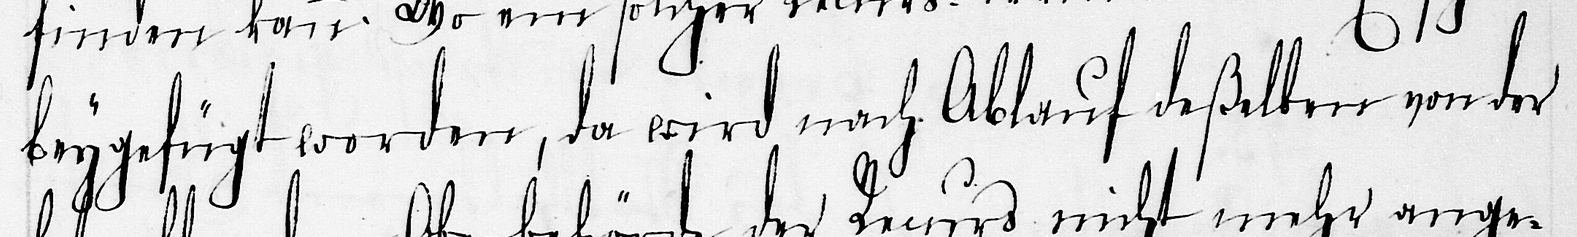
beygefügt worden, da wird nach Ablauf deßelben von der
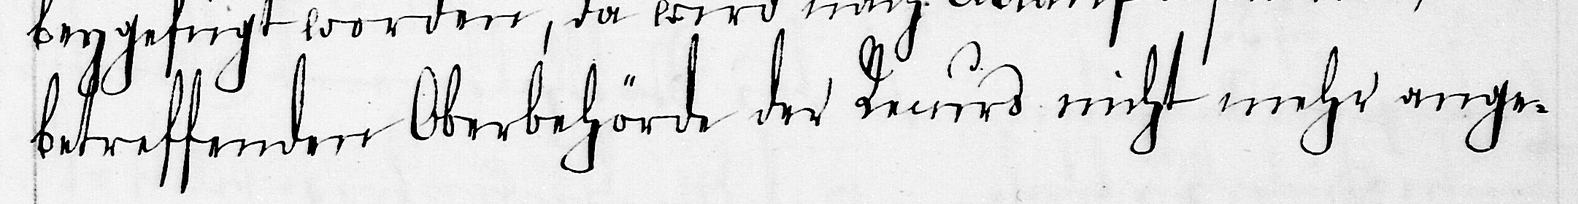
betreffenden Oberbehörde der Recurs nicht mehr ange¬
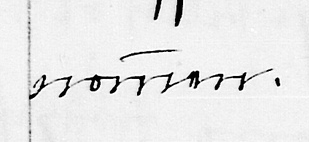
nommen.
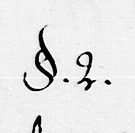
§. 2.
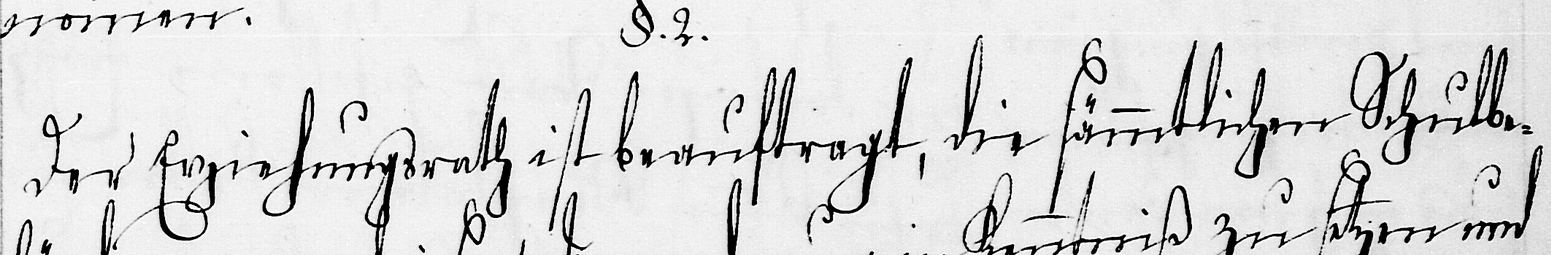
Der Erziehungsrath ist beauftragt, die sämm¬
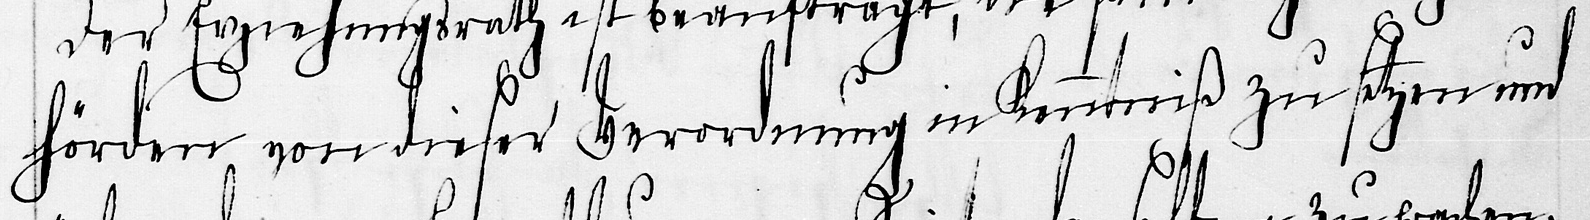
ehörden von dieser Verordnung in Kenntniß zu setzen und
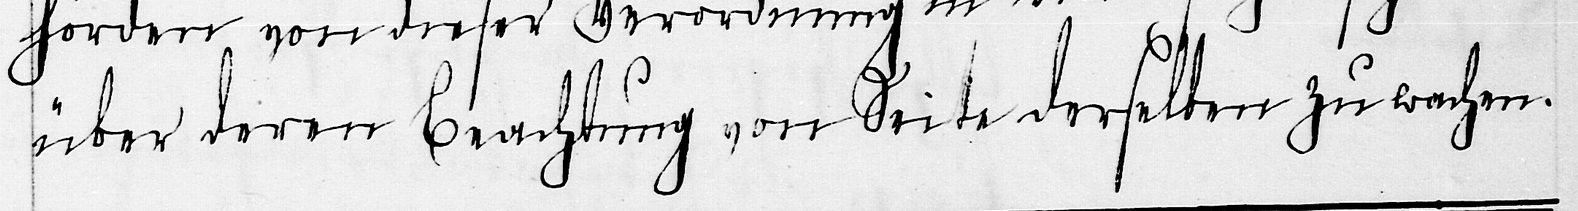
über deren Beachtung von Seite derselben zu wachen.
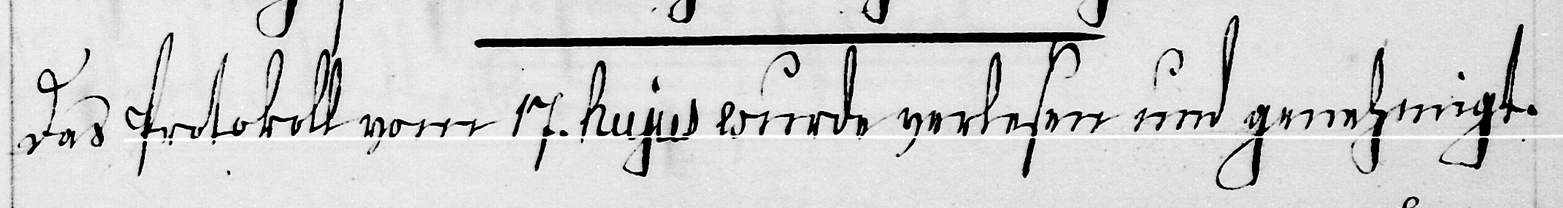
Das Protokoll vom 17. hujus wurde verlesen und genehmigt.
